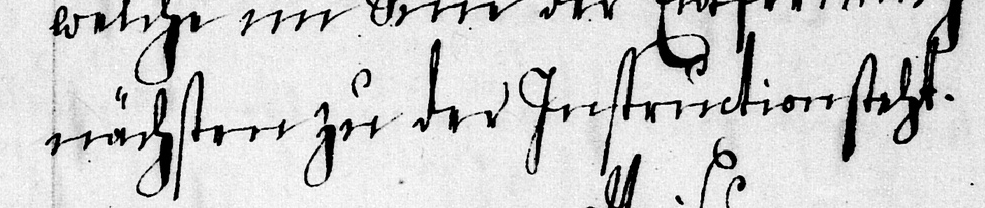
nächsten zu der Instruction steht.
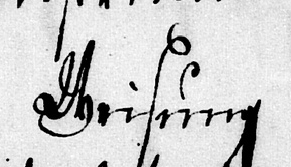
Weisung
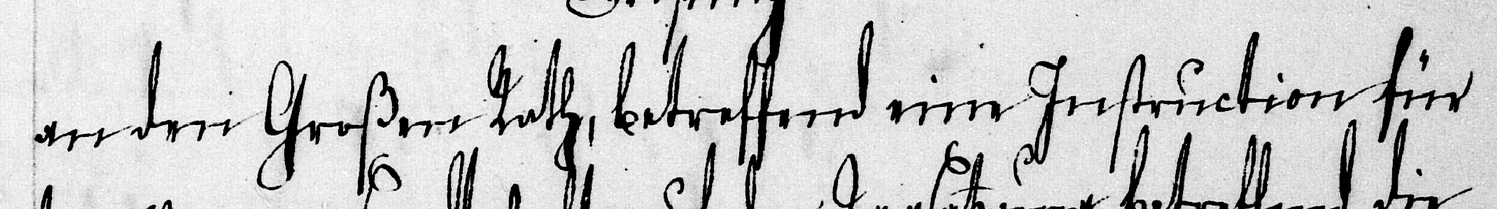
an den Großen Rath, betreffend eine Instruction für
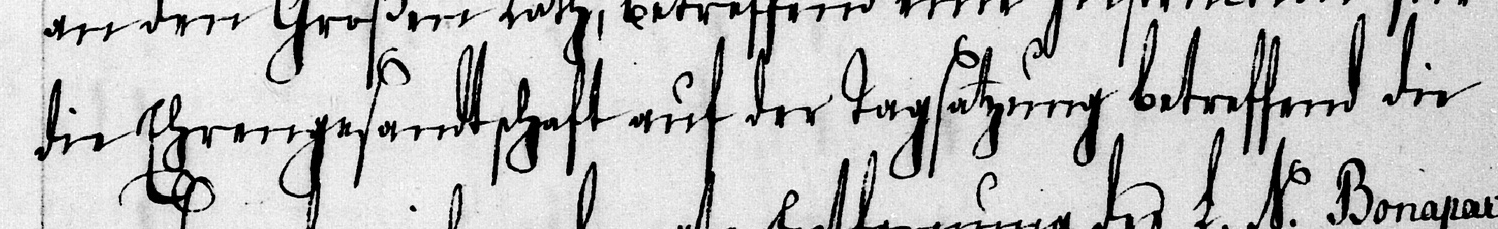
die Ehrengesandtschaft auf der Tagsatzung betreffend die
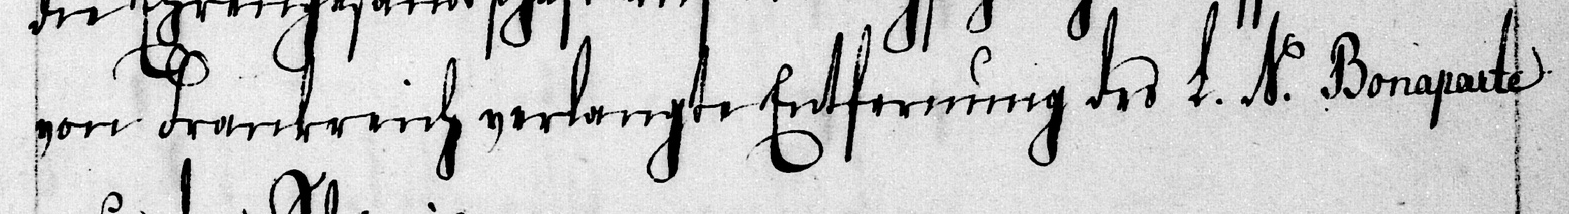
von Frankreich verlangte Entfernung des L. N. Bonaparte
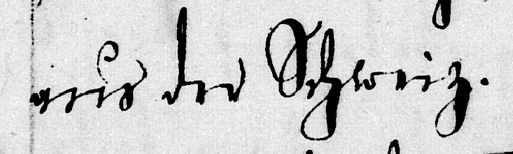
aus der Schweiz.
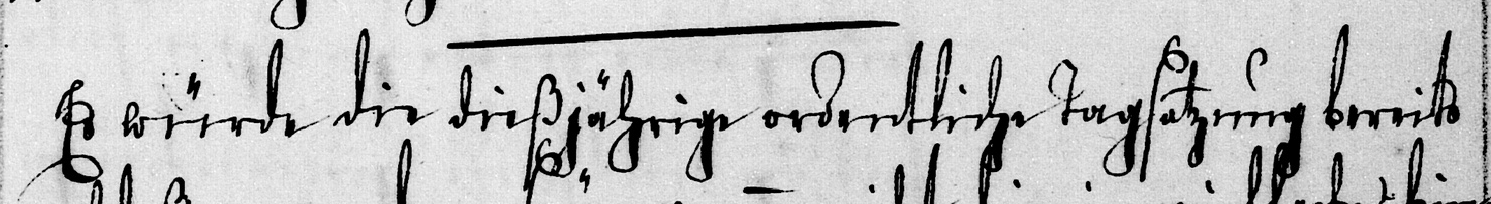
Es würde die dießjährige ordentliche Tagsatzung bereits
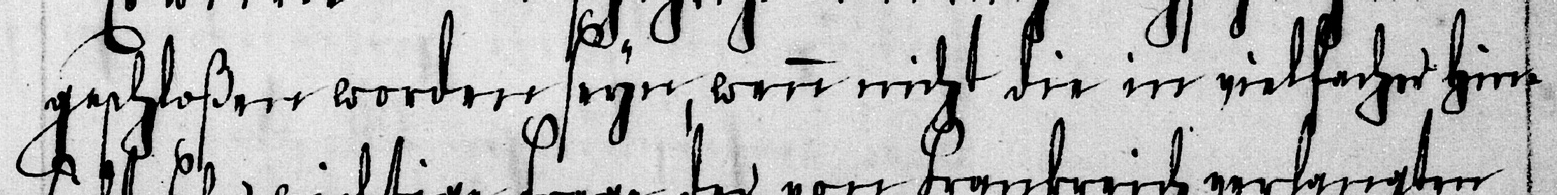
geschloßen worden seyn, wenn nicht die in vielfacher Hin¬
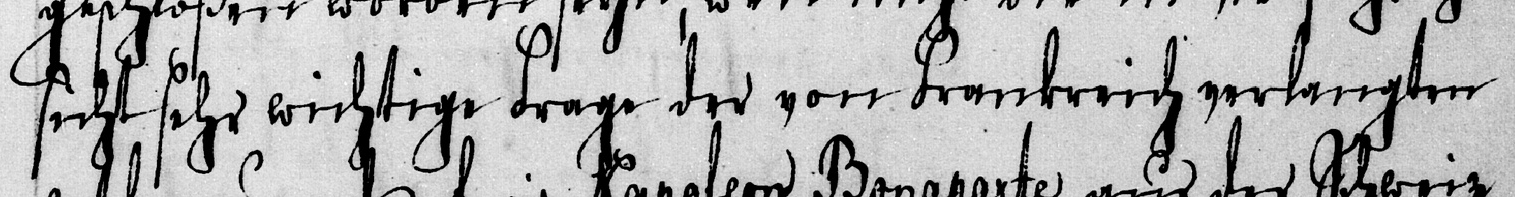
sicht sehr wichtige Frage der von Frankreich verlangten
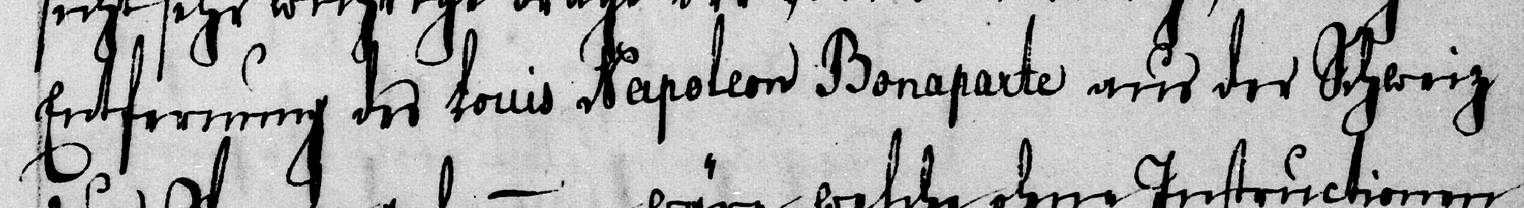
Entfernung des Louis Napoleon Bonaparte aus der Schweiz
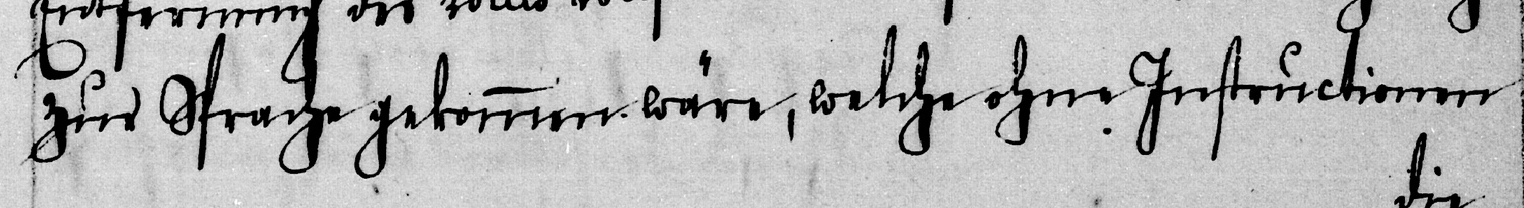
zur Sprache gekommen wäre, welche ohne Instructionen
